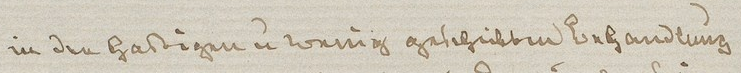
in der hastigen u wenig geschickten Behandlung
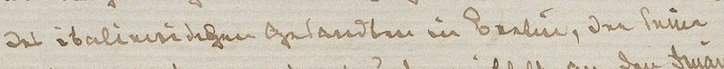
des italienischenGesandten in Berlin, der seine
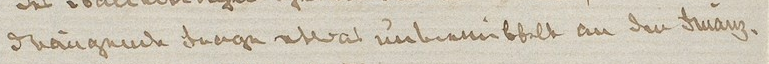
drängende Frage etwas unvermittelt an den Finanz-
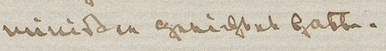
minister gerichtet hatte.
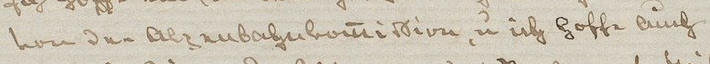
von der Alpenbahnkommission, u ich hoffe auch
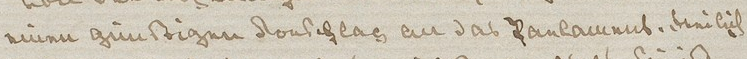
einen günstigen Vorschlag an das Parlament. Freilich
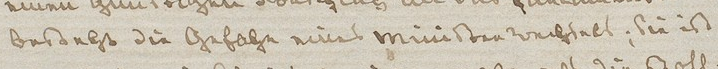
besteht die Gefahr eines Ministerwechsels; sie ist
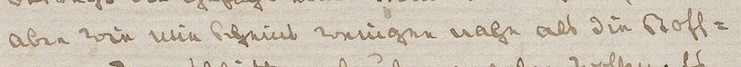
aber wie mir scheint weniger nahe als die stoff-
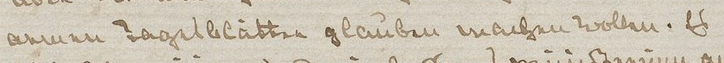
armen Tagesblätter glauben machen wollen. Es
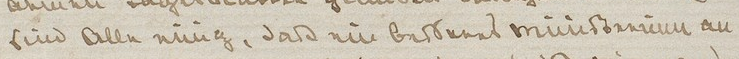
sind Alle einig, daß ein besseres Ministerium an
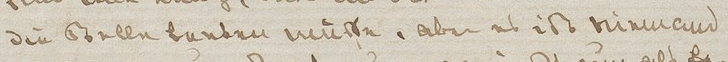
die Stelle treten müsse, aber es ist Niemand
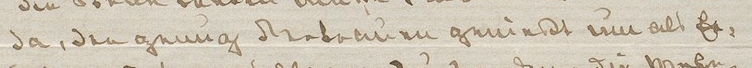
da, der genug Vertrauen genießt um als Er-
